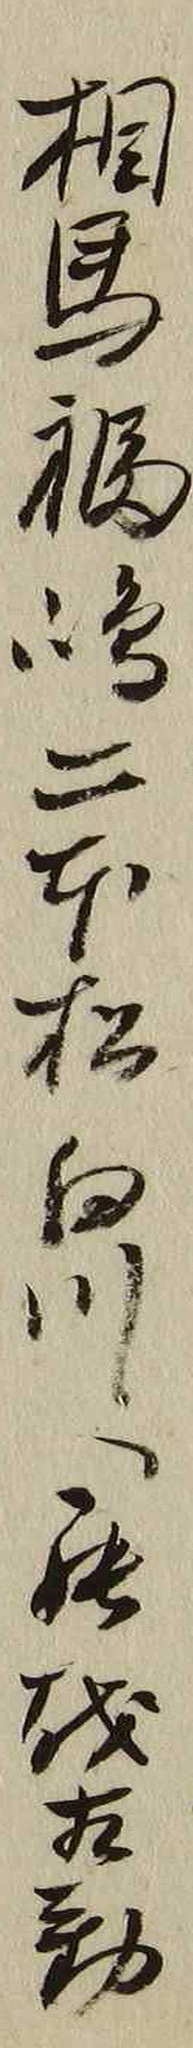相馬福島二本松白川罷越相勤
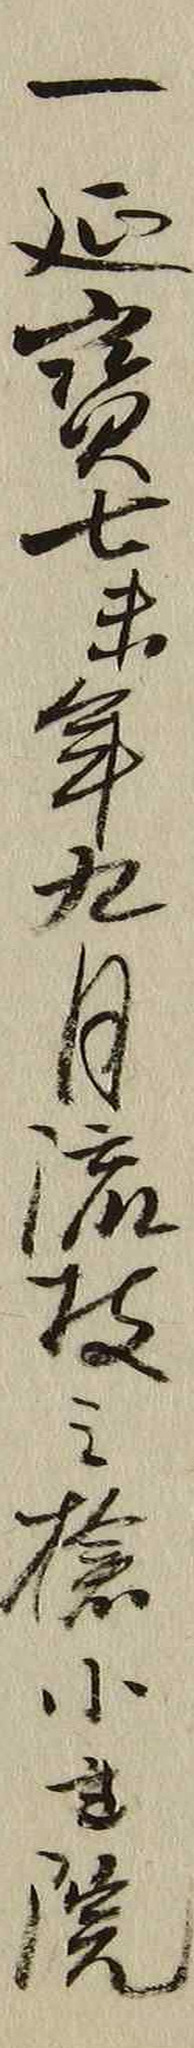一延宝七未年九月流枝之槍小書院
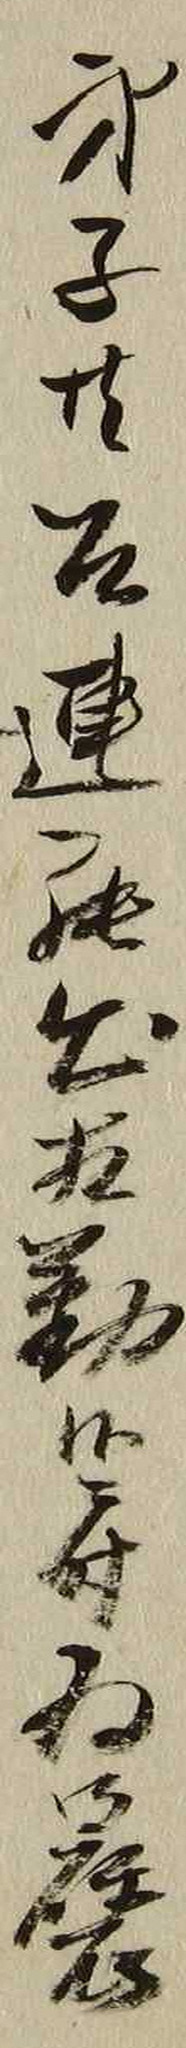弟子共召連罷出相勤候付為御褒
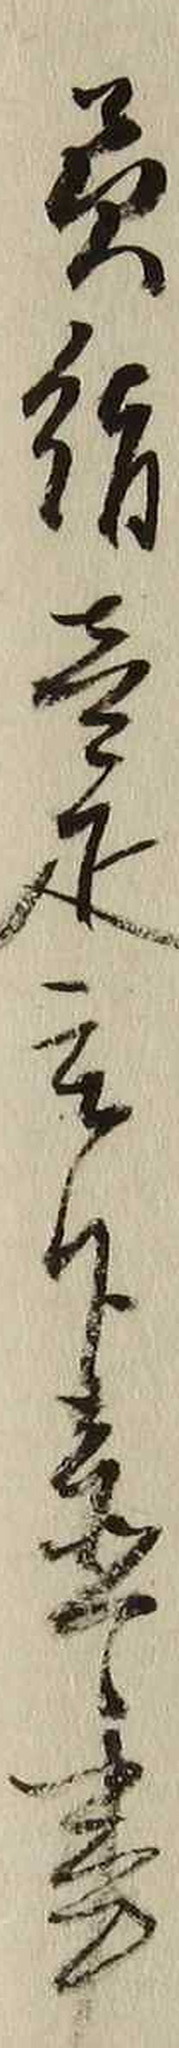美絹壱疋被下置候事
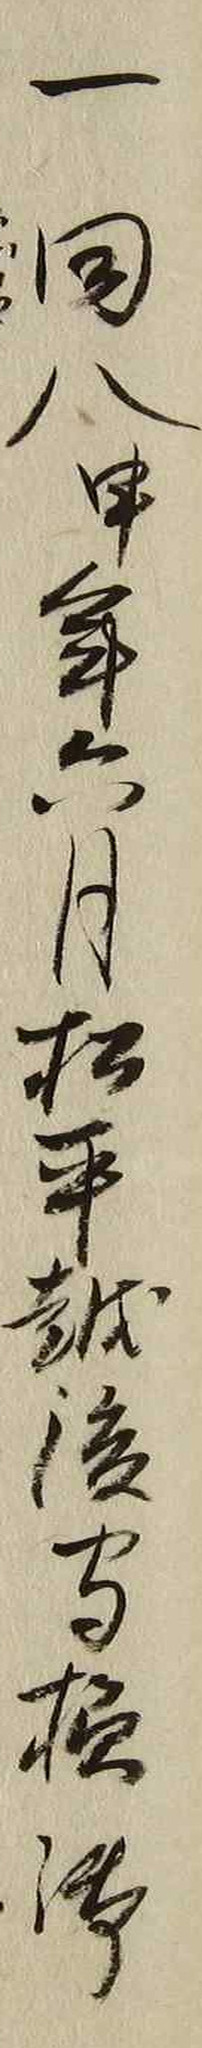一同八申年六月松平越後守様御
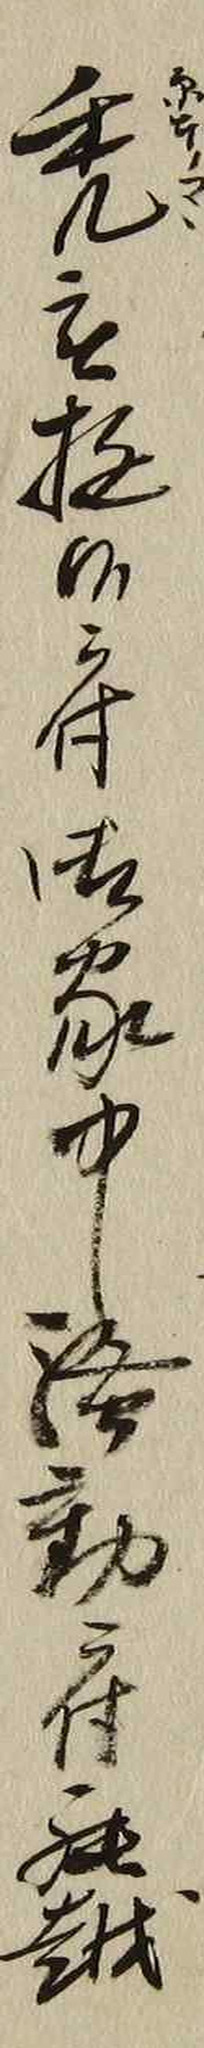禿被遊候付御家中騒動付罷越
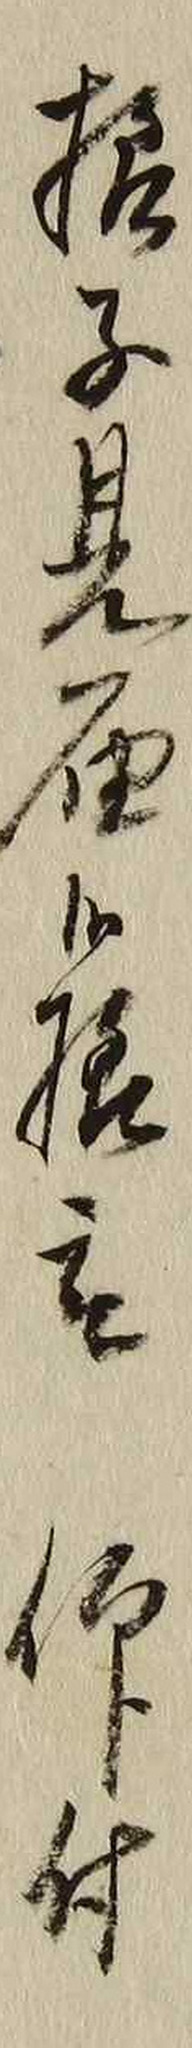様子見届候様被仰付
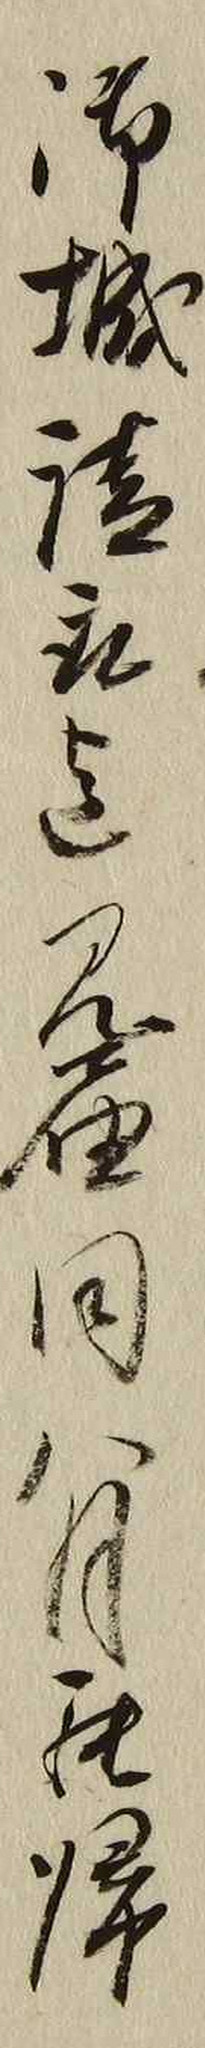御城請取迄見届同八月罷帰
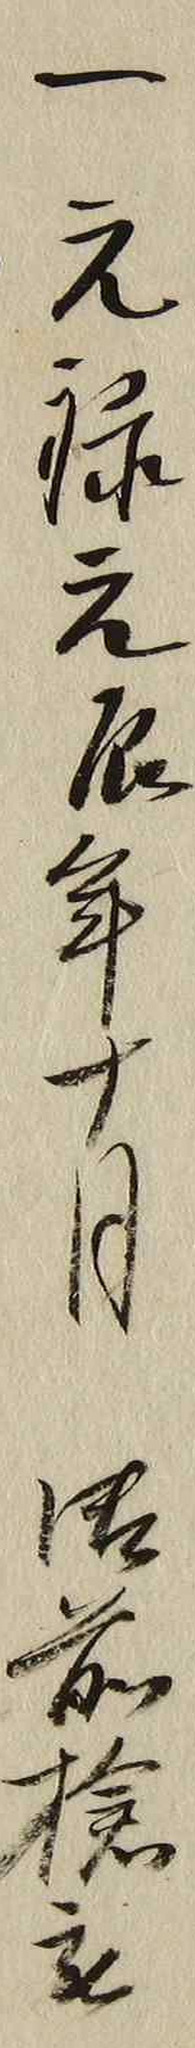一元禄元辰年十月御前槍被
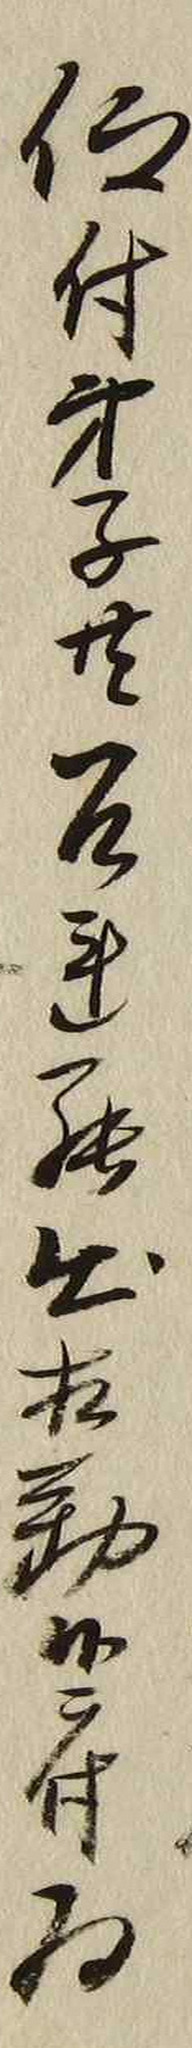仰付弟子共召連罷出相勤候付為
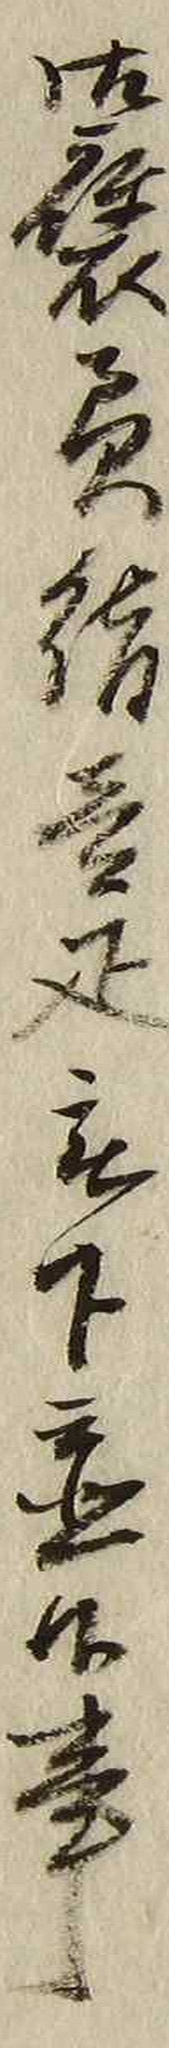御褒美絹壱疋被下置候事
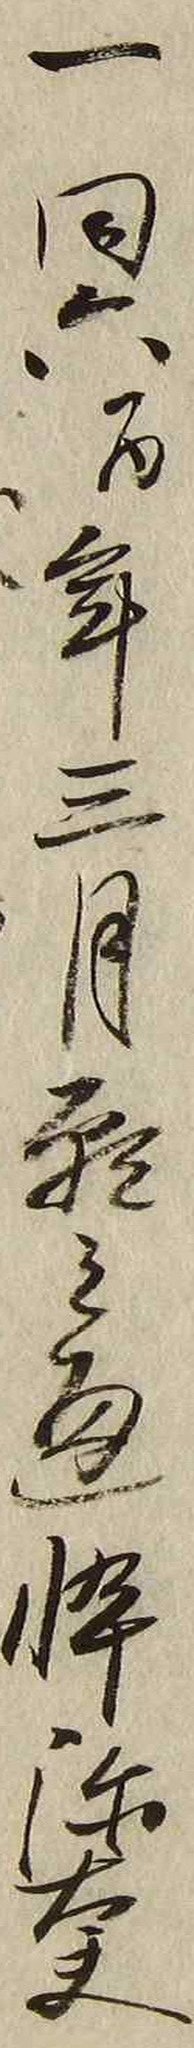一同六酉年三月願之通忰弥太夫
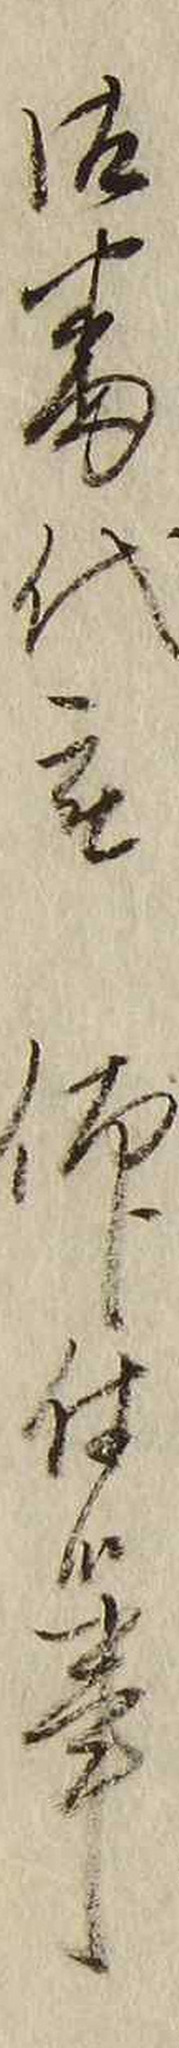御番代被仰付候事

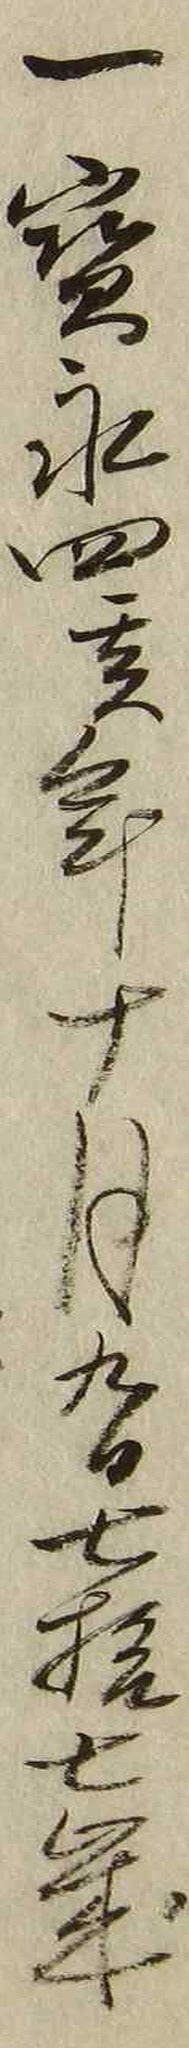一宝永四亥年十月九日七拾七歳
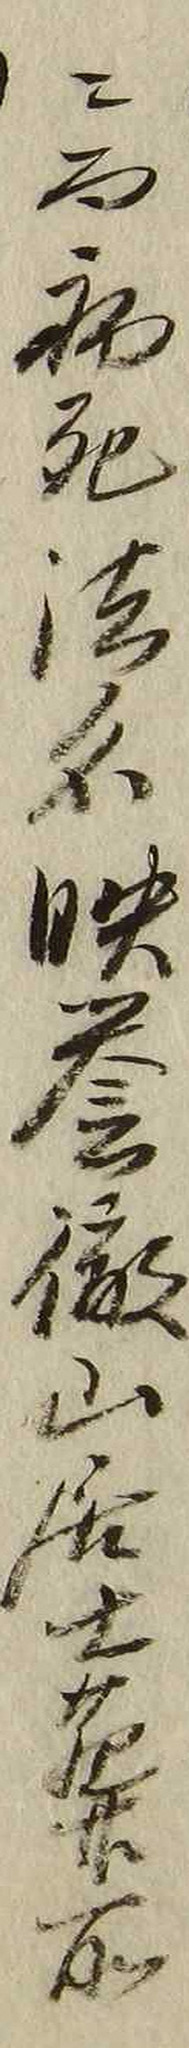ニ而病死法名映誉徹山居士葬所
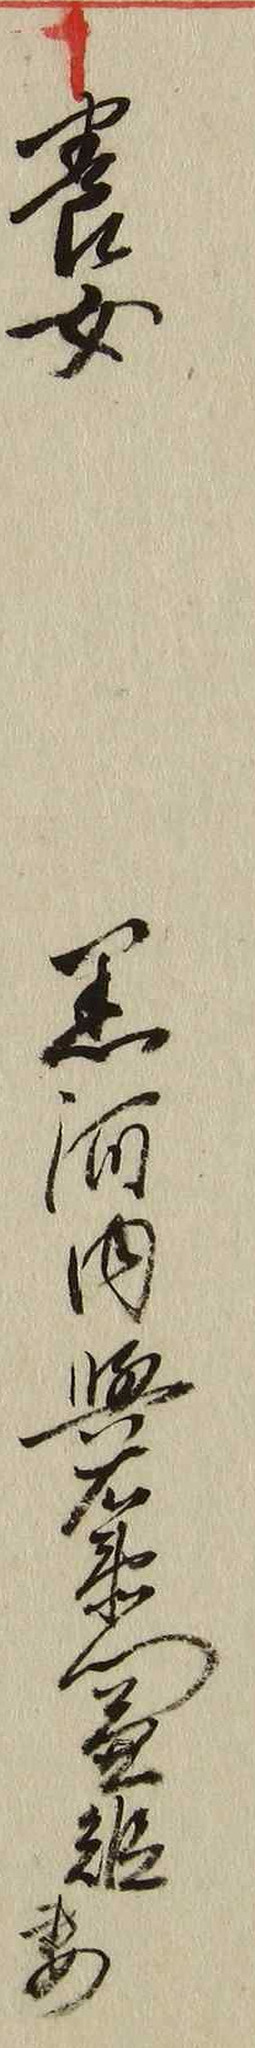養女黒河内与右衛門兼矩妻
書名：諸士系譜　巻之350　せ之部1冊全
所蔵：会津若松市立会津図書館
